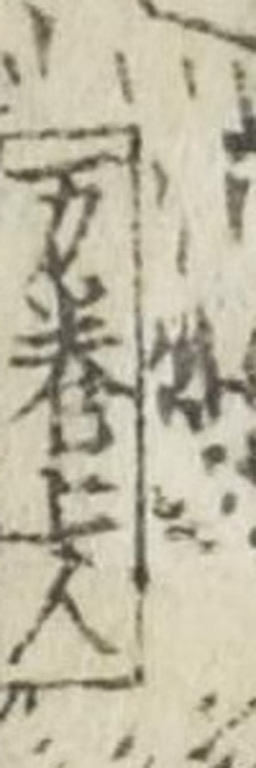万巻上人
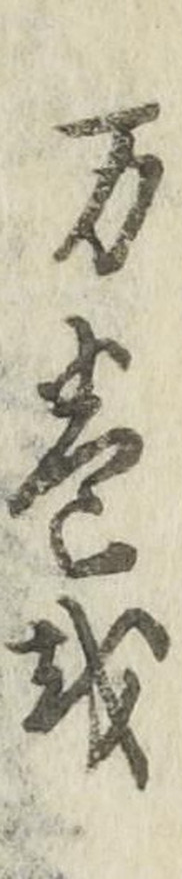万巻を
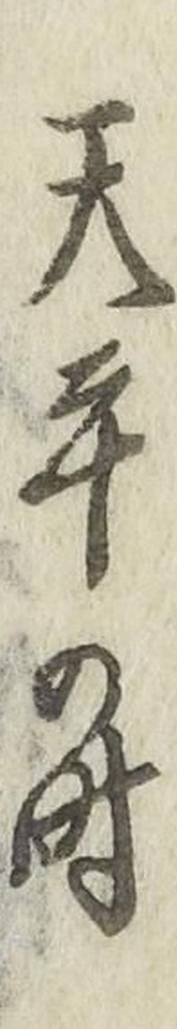天平の時
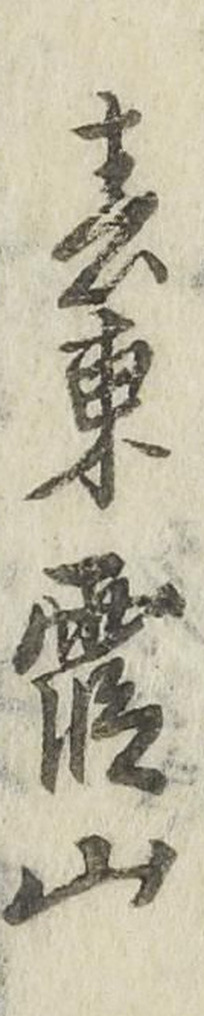春東霞山

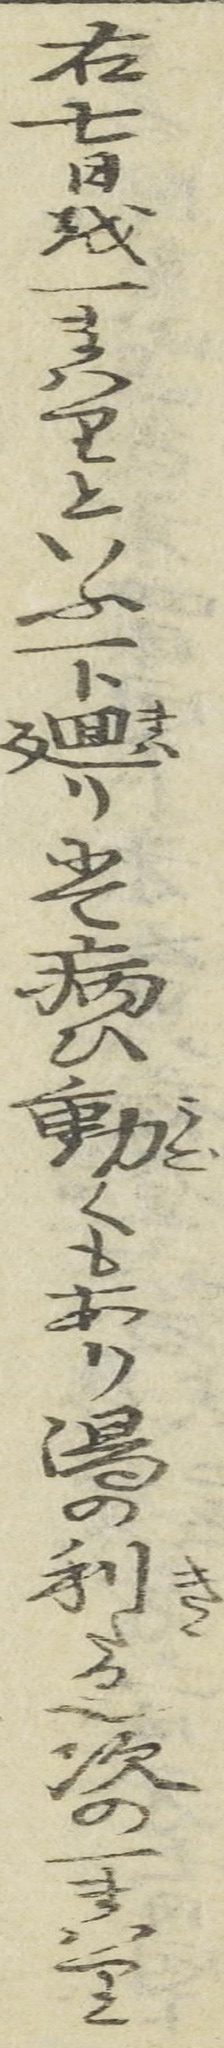右七日を一まはりといふ一ト廻りにて病ひ動くもあり湯の利たる也次の一まはり
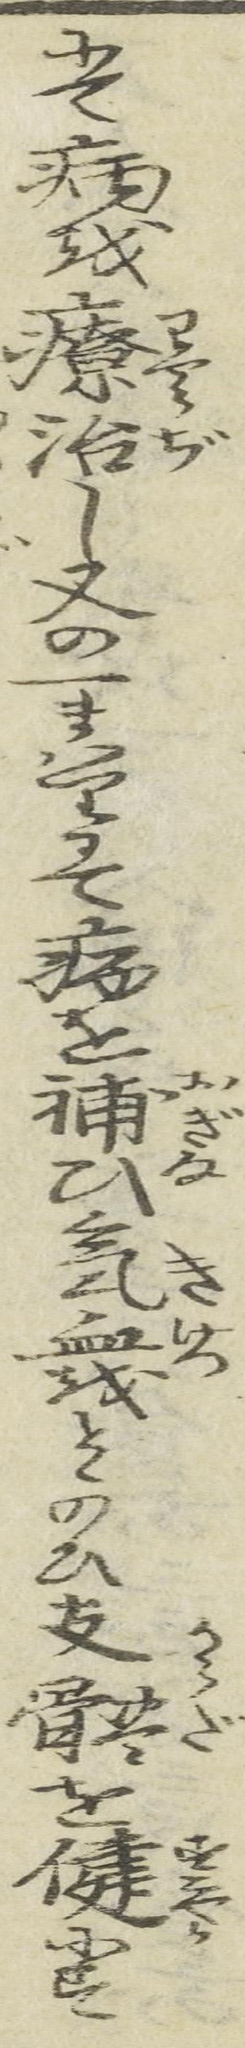にて病を療治し又の一まはりにて病を補ひ気血をとゝのひ支體を健にす
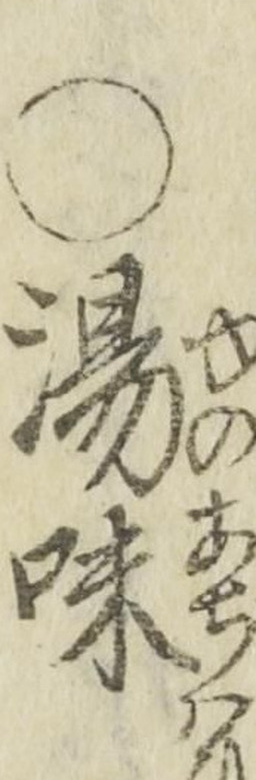○湯味
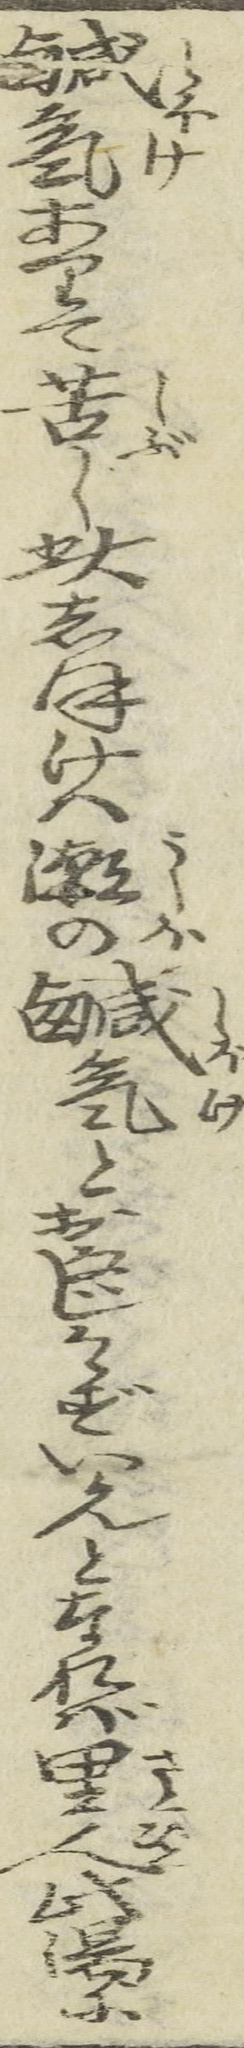鹹気ありて苦し此しほけは潮の鹹気とおなじからずいかんとなれば里人此湯に
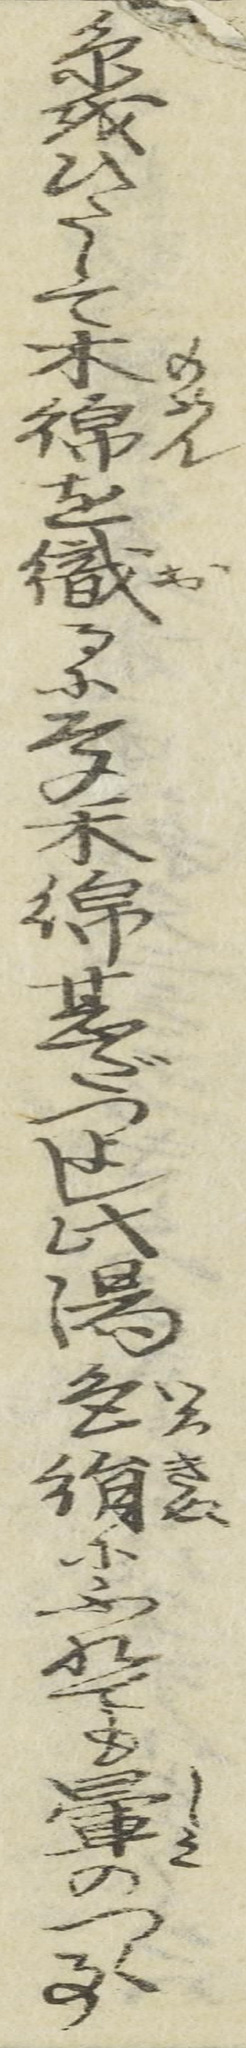糸をひたして木綿を織るにその木綿甚だつよし此湯色絹にふれても暈のつく事
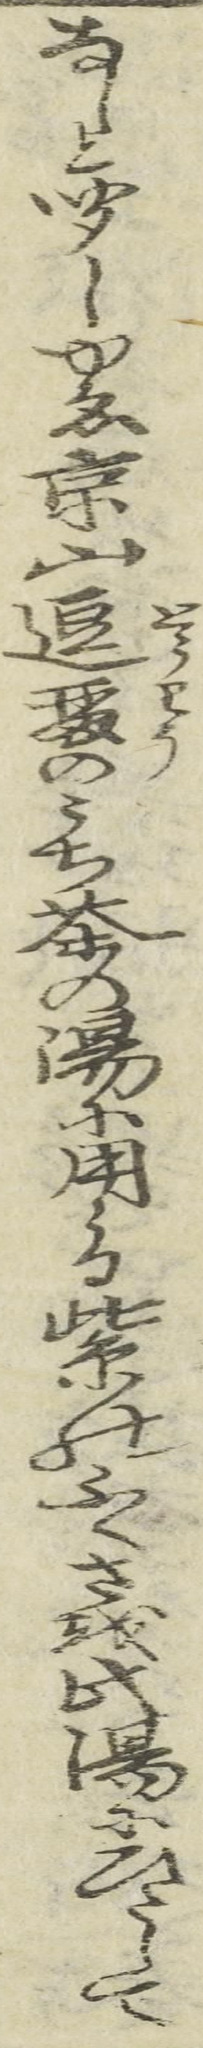なしと聞しゆゑ京山逗留のうち茶の湯に用る紫のふくさを此湯にひたして
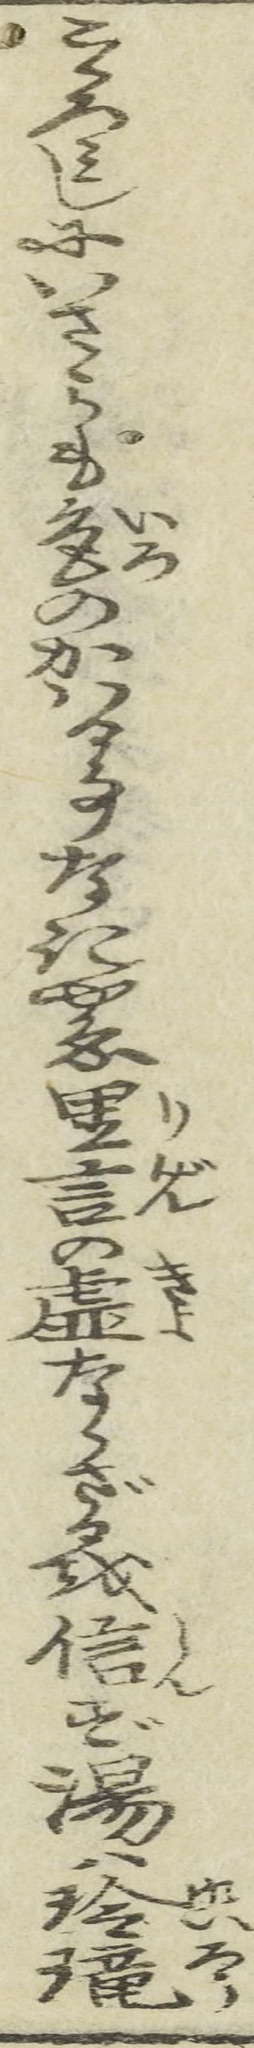こゝろみしにいさゝかも色のかはる事なきゆゑ里言の虚ならざるを信ず湯は玲瓏
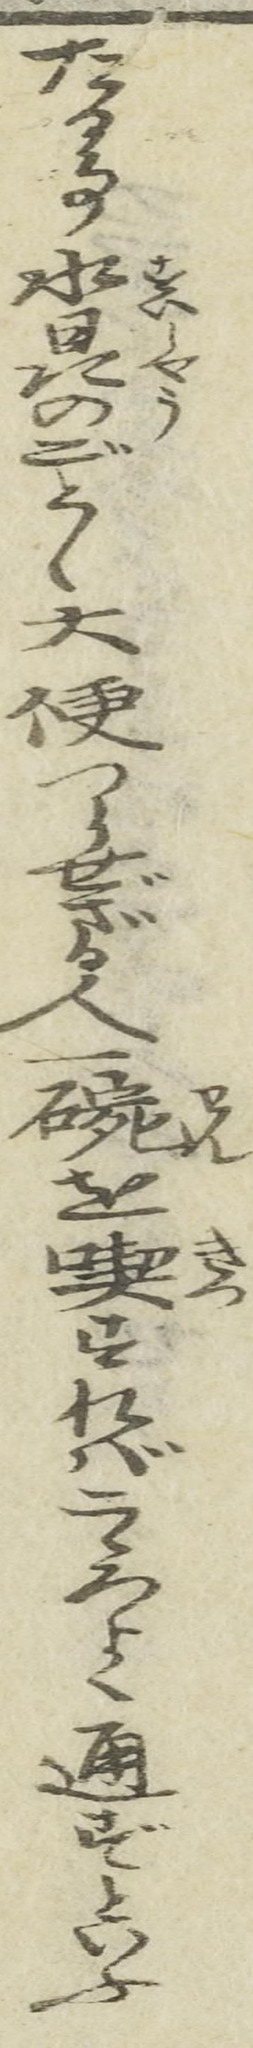たる事水晶のごとし大便つうぜざる人一碗を喫すればこゝろよく通ずといふ
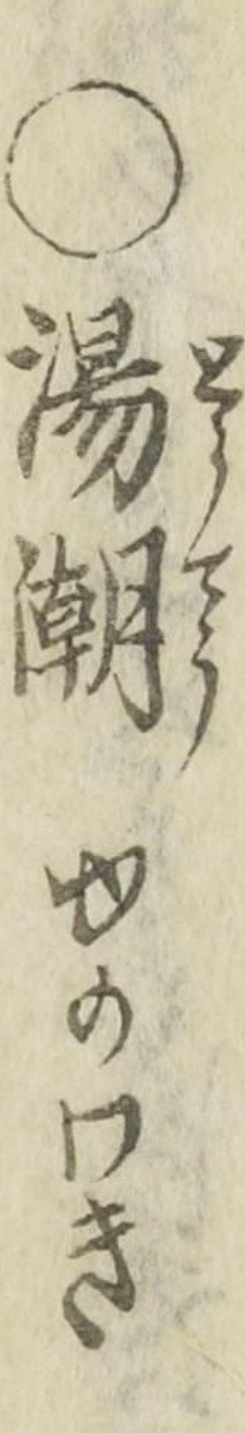○湯潮ゆのわき
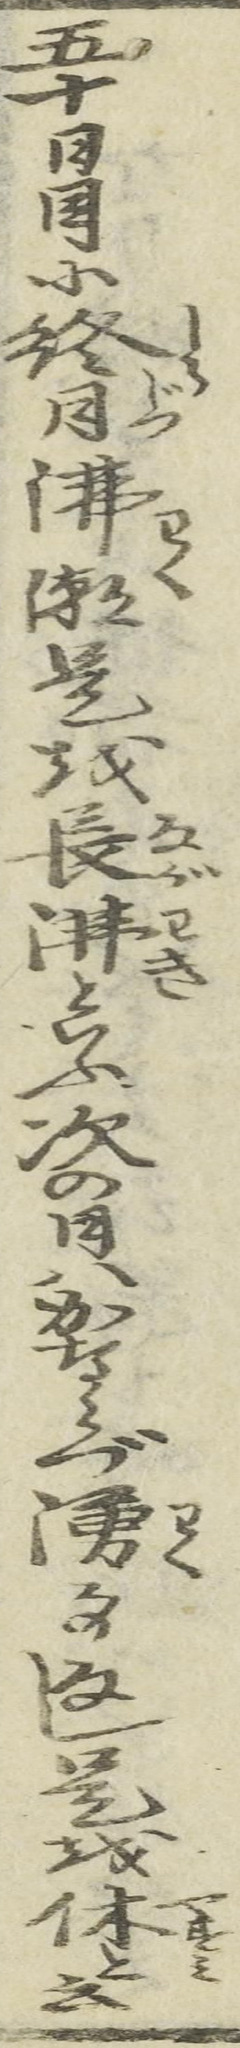五十日目に終日沸瀬を長沸といふ次の日はかならづ湧事なし是を休と云
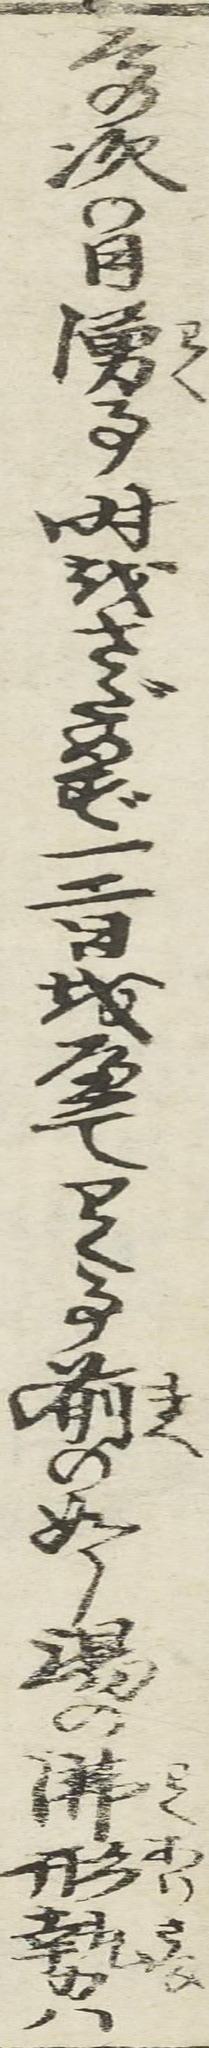その次の日湧事時をさだめず一二日をへてわく事前の如し湯の沸形勢は
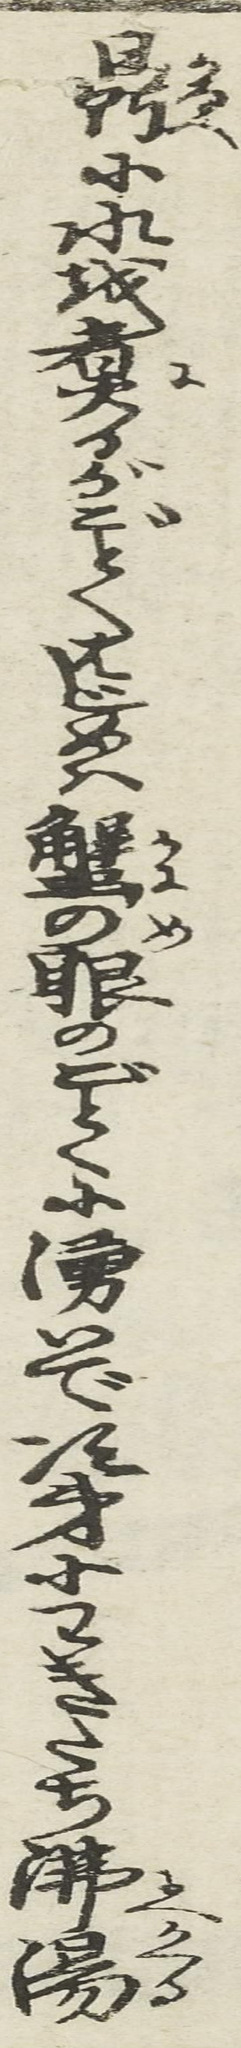鼎に水を煮るがごとくはじめは蟹の眼のごとくに湧いで次第にわきたち沸湯
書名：熱海温泉圖彙
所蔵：東京大学地震研究所図書室 Earthquake Research Institute Library, The University of Tokyo, JAPAN
